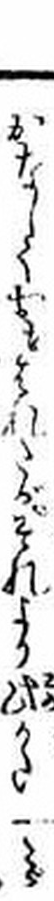かなしくおもはれたがそれより此かた
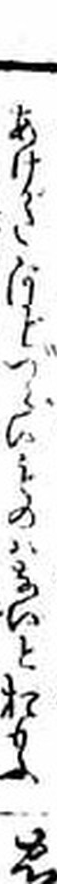あけがたほどつらいものはないとおもふ忠
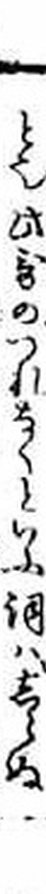と也此の身のつれなくといふ詞はしらぬ岑
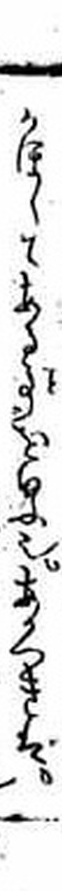かほしてある事といふ也あかつきは
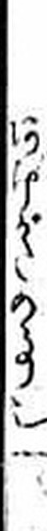あけがたの事也
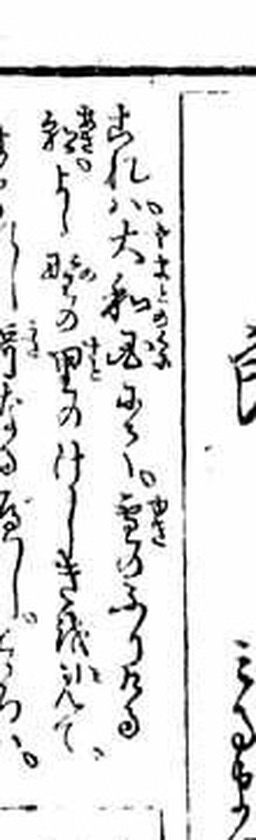これは大和国にて雪のふりける
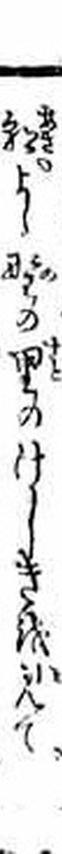朝よりよし野の里のけしきを見て坂
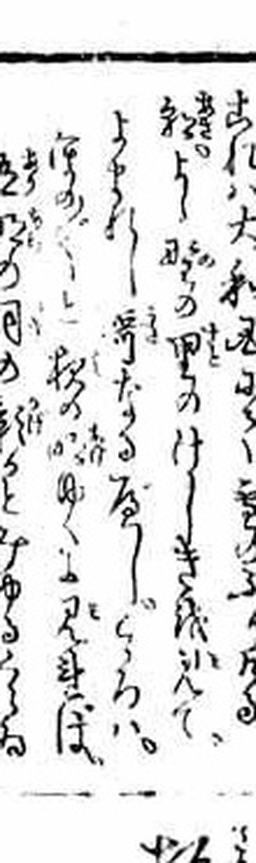よまれし哥なるべしこゝろは上
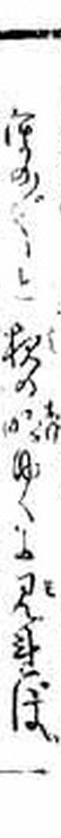ほの〴〵と夜のあけゆくに見れば
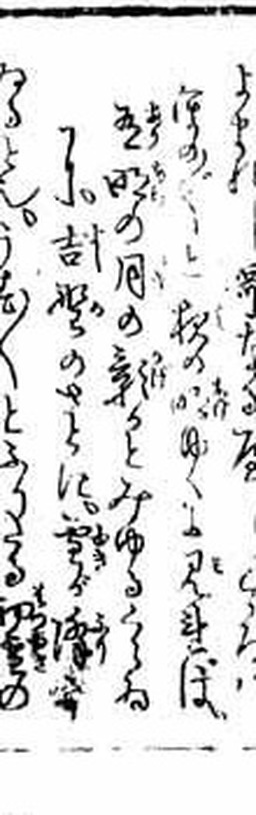有明の月の影かとみゆるくらゐ
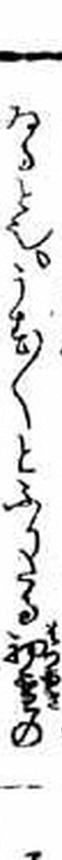ゐると也すうす〳〵とふりたる初雪の
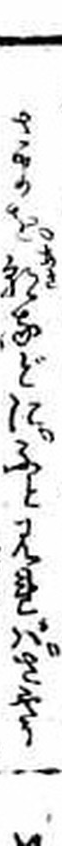さまを朝などにふと見ばさやう是
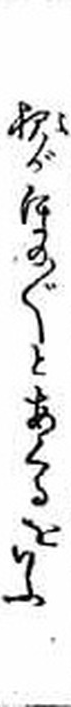夜がほの〴〵とあくるをいふ

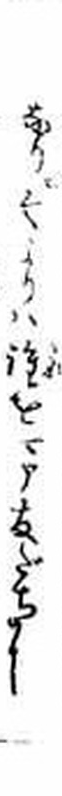なり今よりは誰をマア友だちに
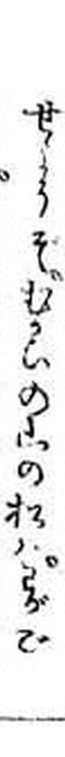せようぞむかいの山の松はわがご
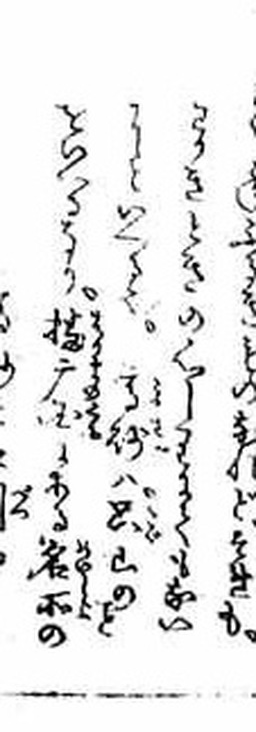にといへる也高砂は只山のことを風
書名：小倉百人一首
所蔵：東京学芸大学教育コンテンツアーカイブ
